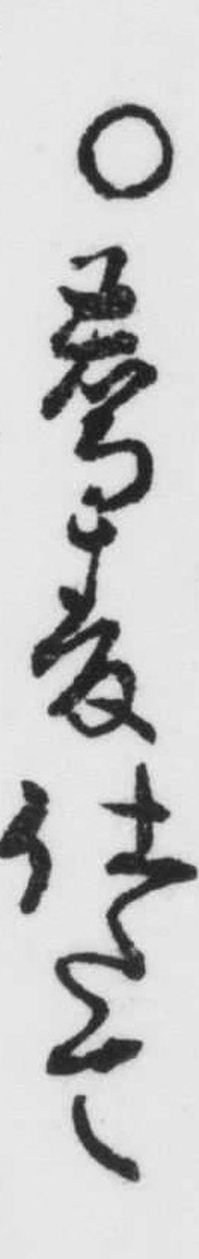○蕎麦仕たて
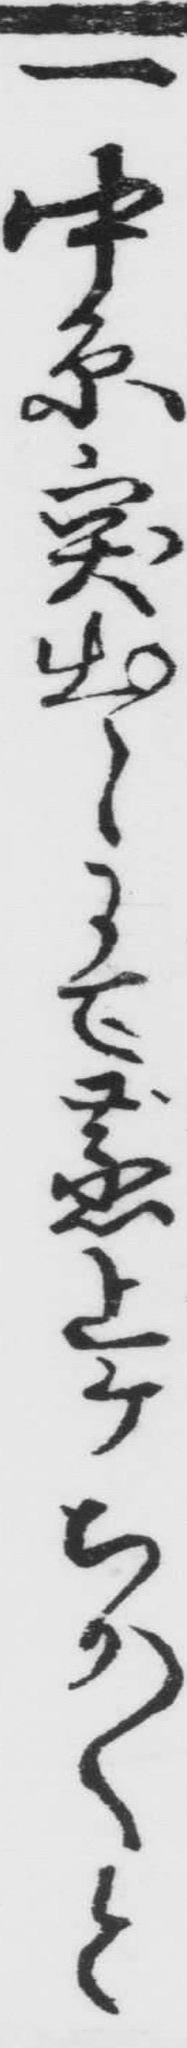一中糸突出しにて蒸上けちり〳〵と
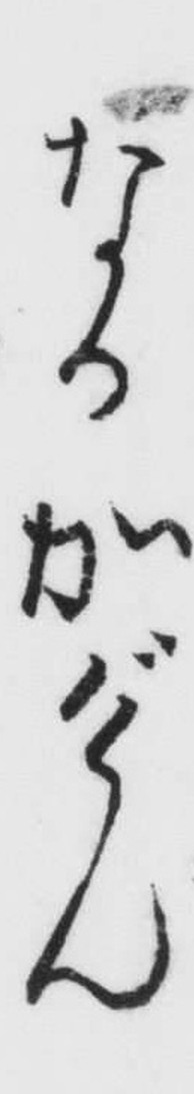なるかげん
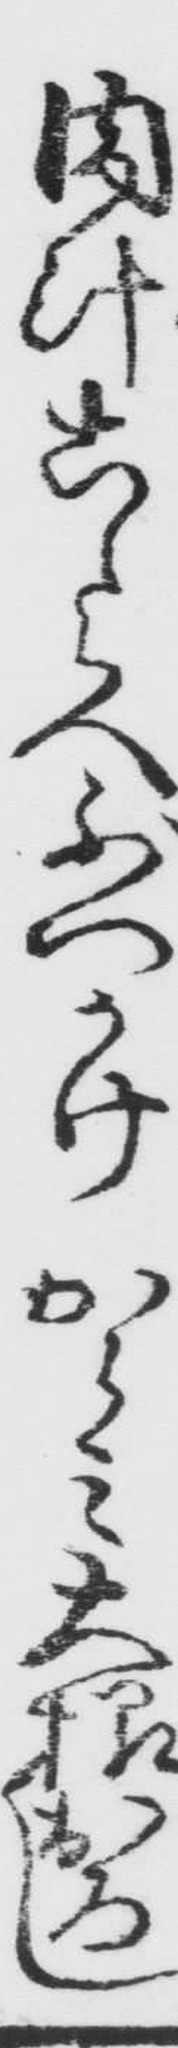肉汁こしらへぶつかけからみ大根おろし
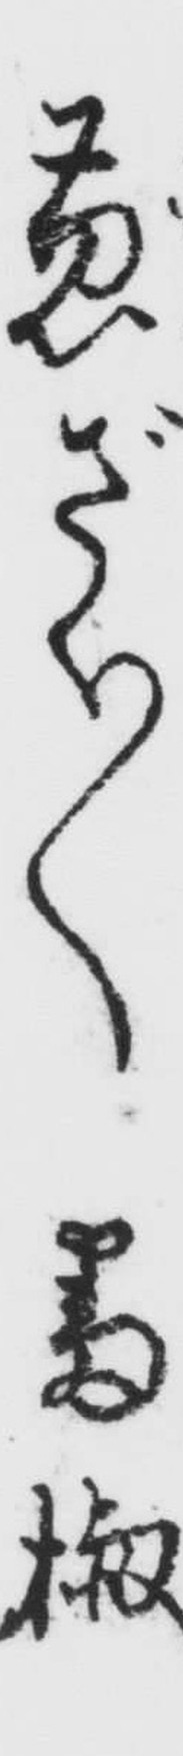葱ざく〳〵番椒
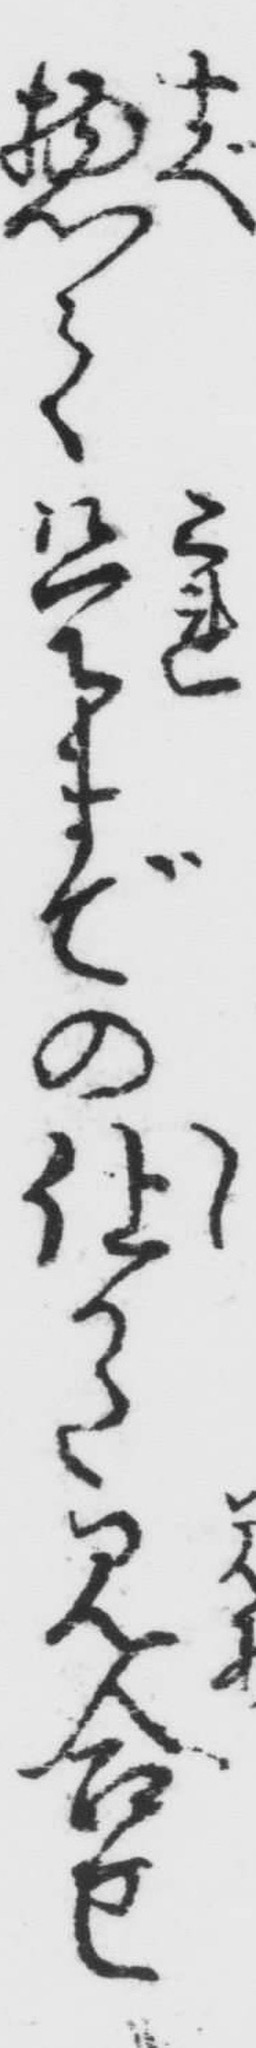惣て是までの仕かた見合せ
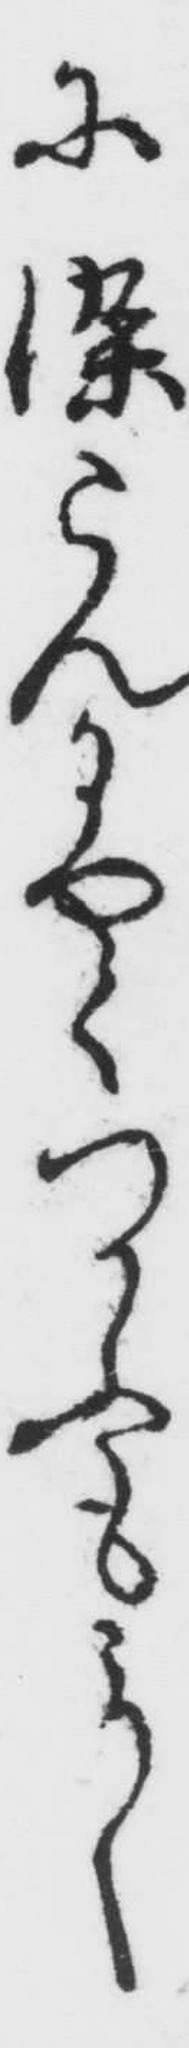に染こんにやくつかふもよし
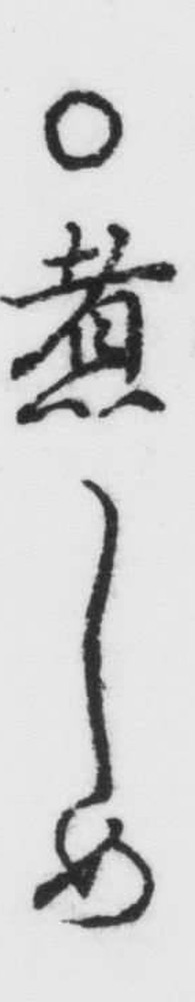○煮しめ
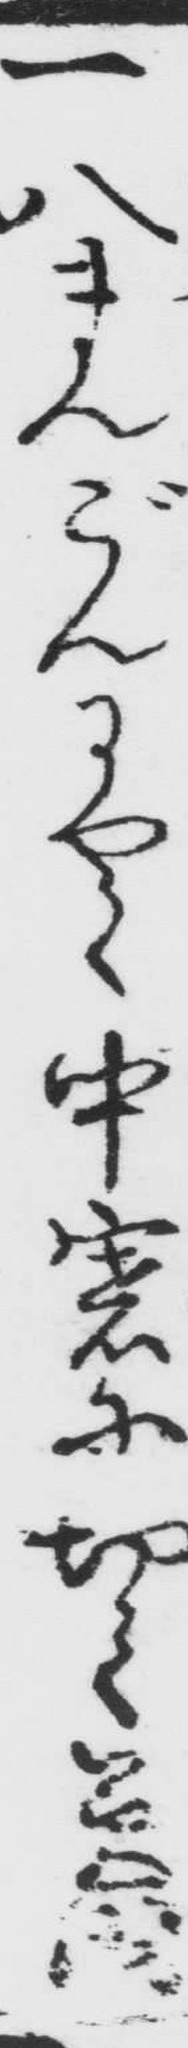一八まんごんにやく中賽に切て美淋
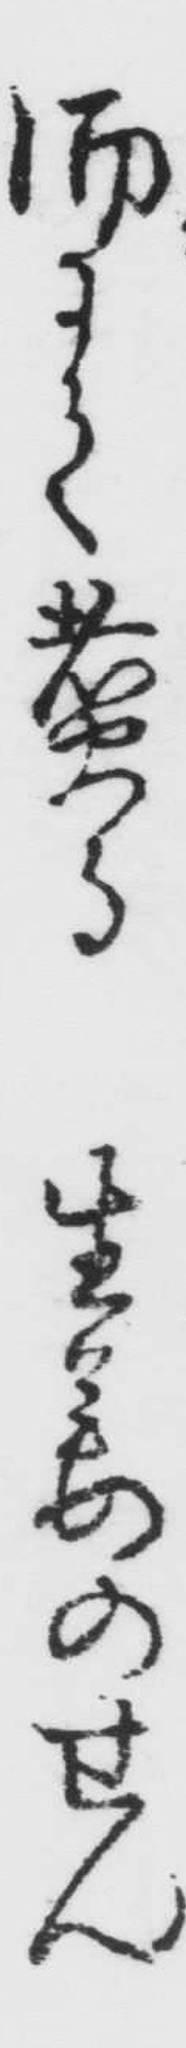酒にて煮る生姜のせん

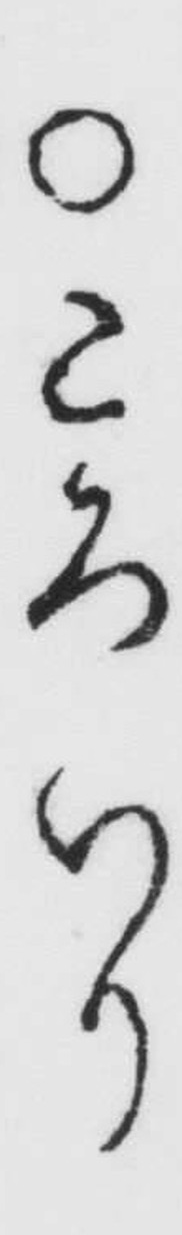○ころいり
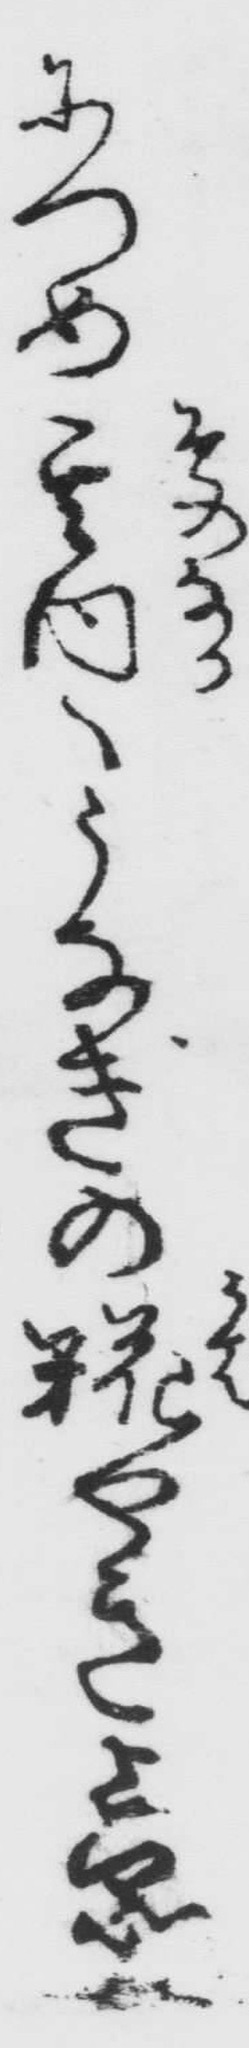につめ其内へうなぎの椛やき上品
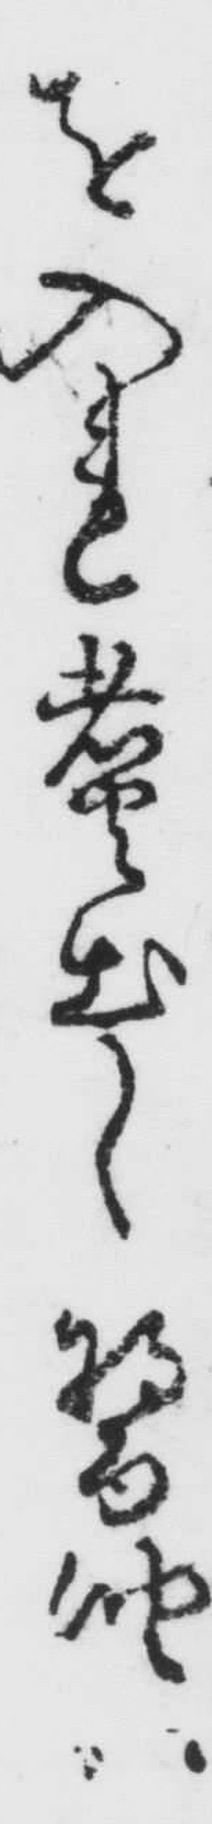を入れ煮出し醤油
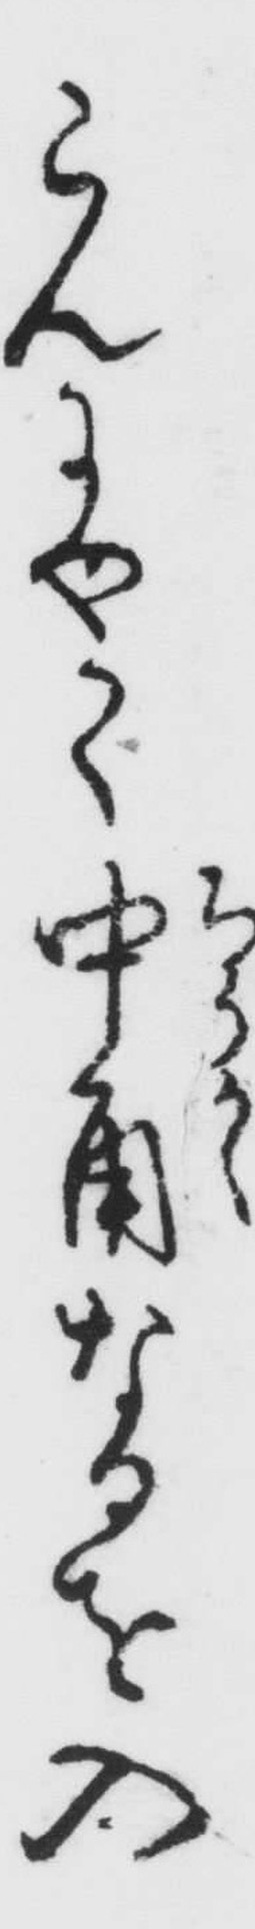こんにやく中角なるを入
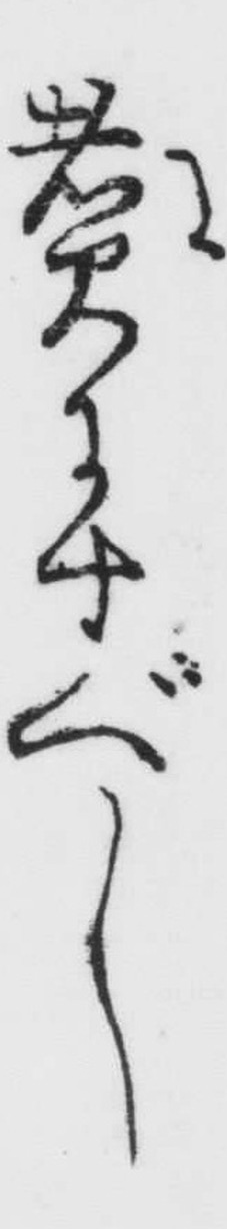煮にすべし
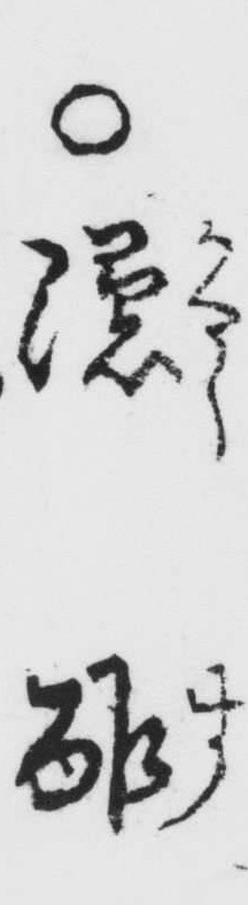○隠酢
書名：蒟蒻百珍
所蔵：大阪府立大学学術情報センター 国文学研究資料館
